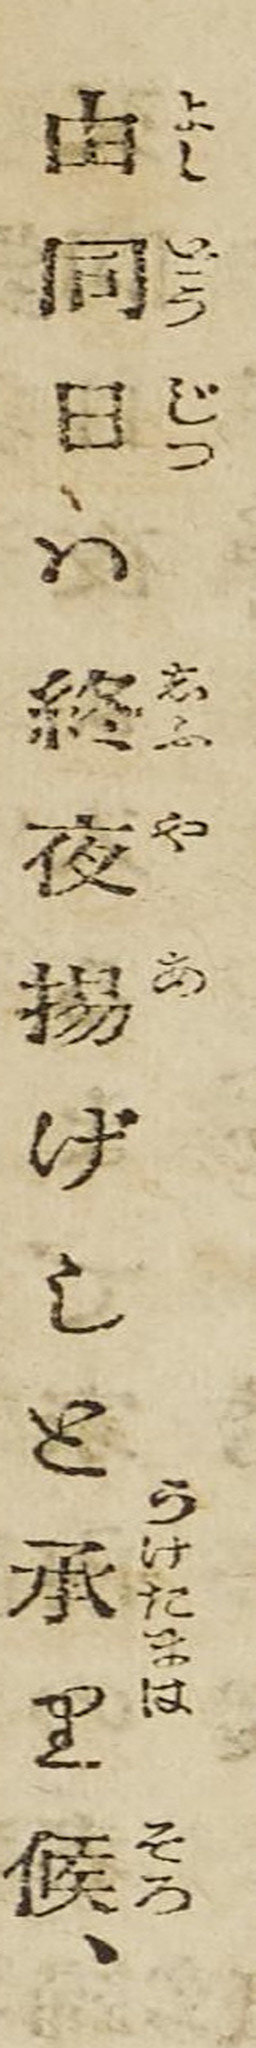由同日は終夜揚げしと承り候、

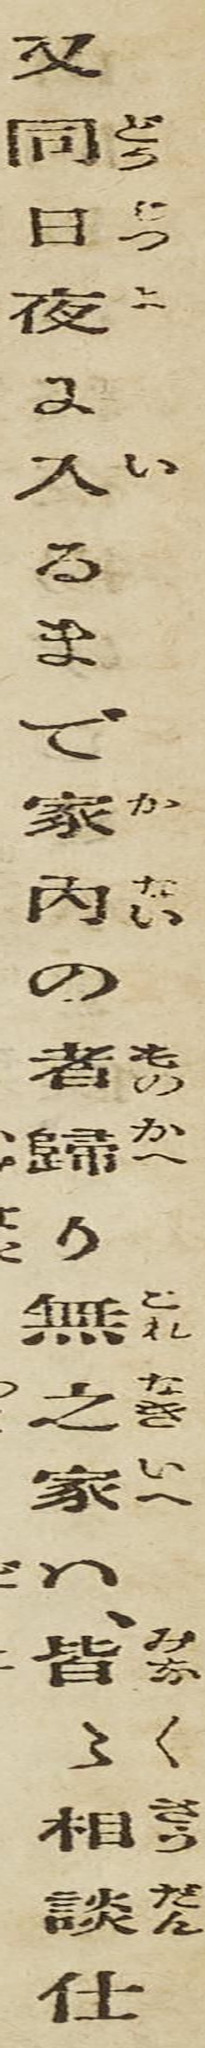又同日夜に入るまで家内の者帰り無之家は、皆〻相談仕
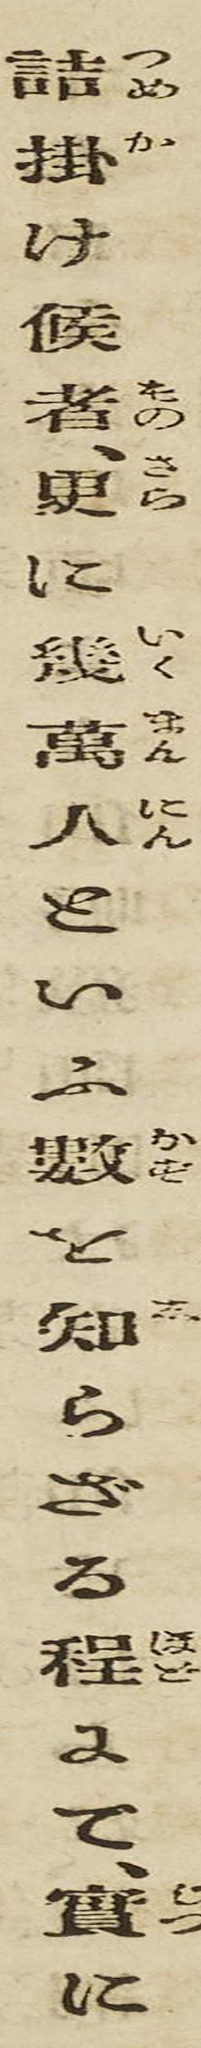詰掛け候者、更に幾万人といふ数を知らざる程にて、実に
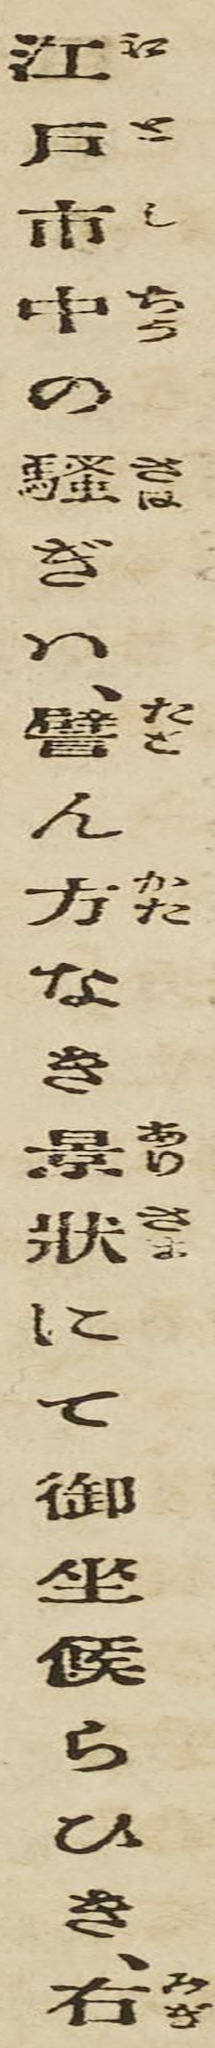江戸市中の騒ぎは、譬ん方なき景状にて御座候らひき、右
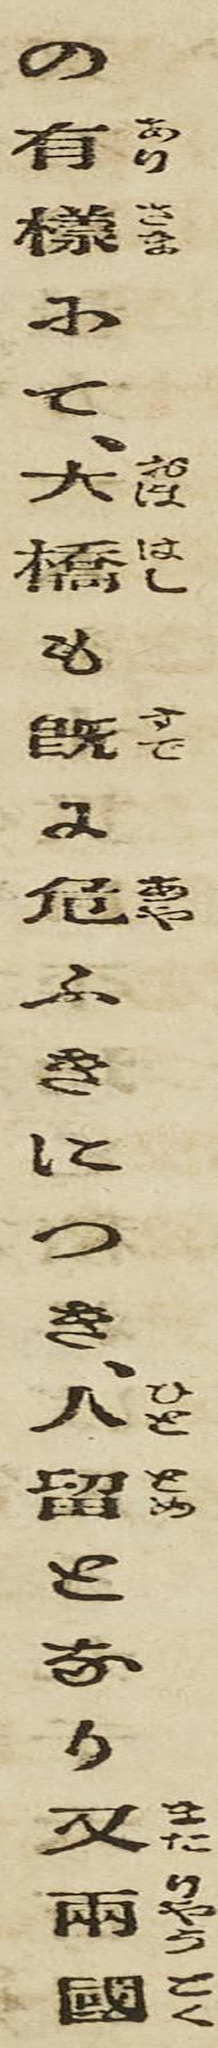の有様にて、大橋も既に危ふきにつき、人留となり又両国
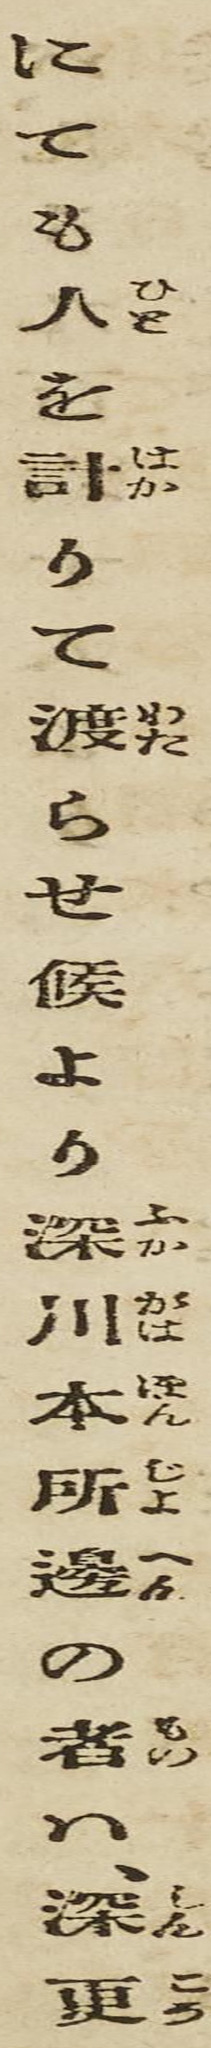にても人を計りて渡らせ候より深川本所辺の者は、深更
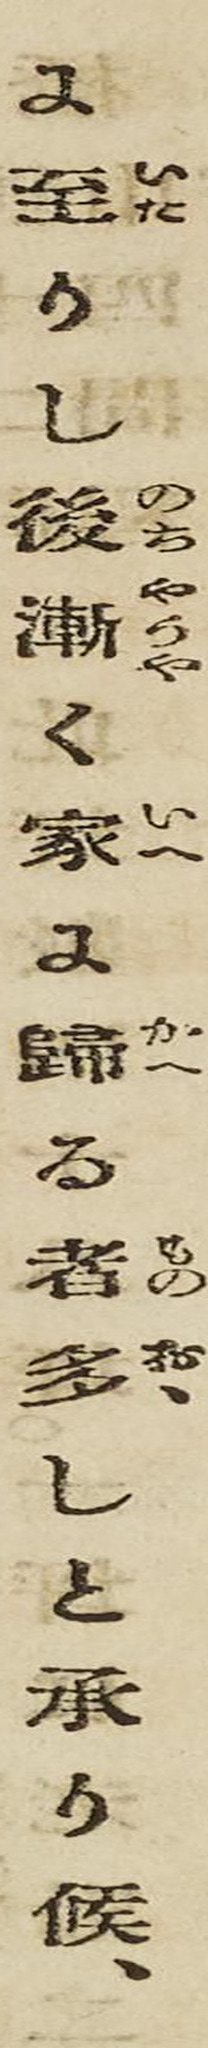に至りし後漸く家に帰る者多しと承り候、
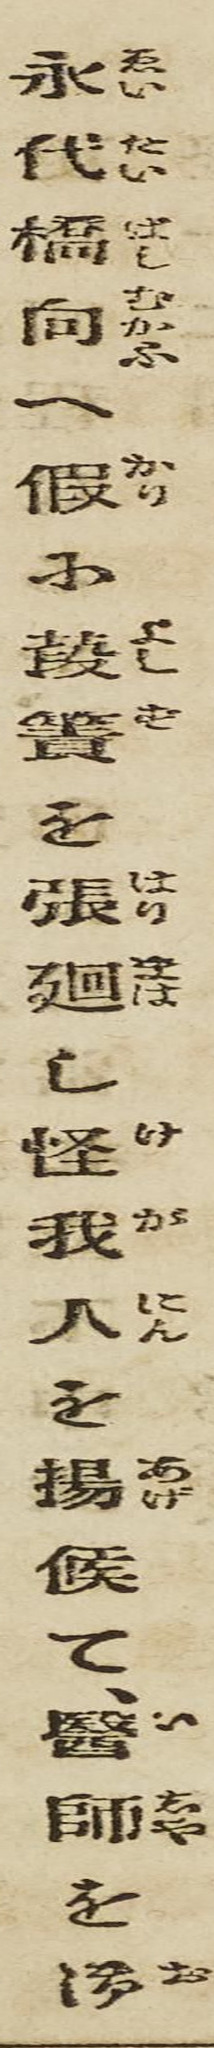永代橋向へ假に葭簀を張廻し怪我人を揚候て、医師を御
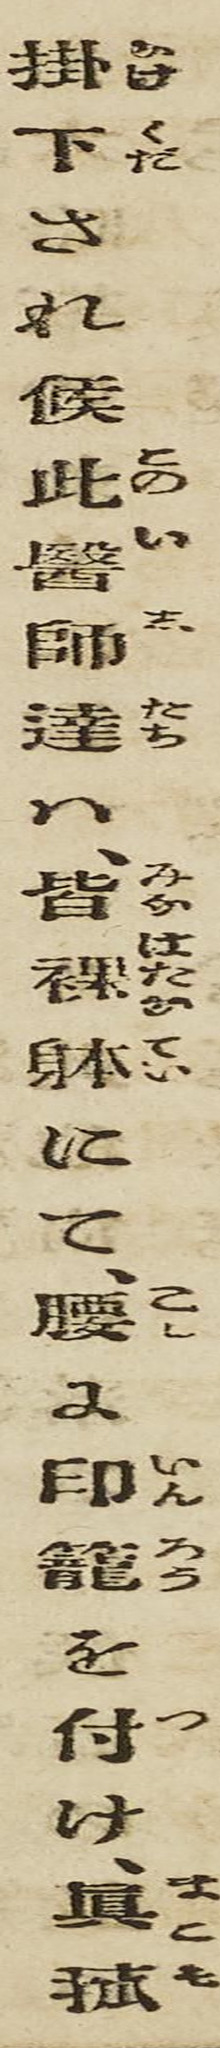掛下され候此医者達は、皆裸体にて、腰に印籠を付け、真菰
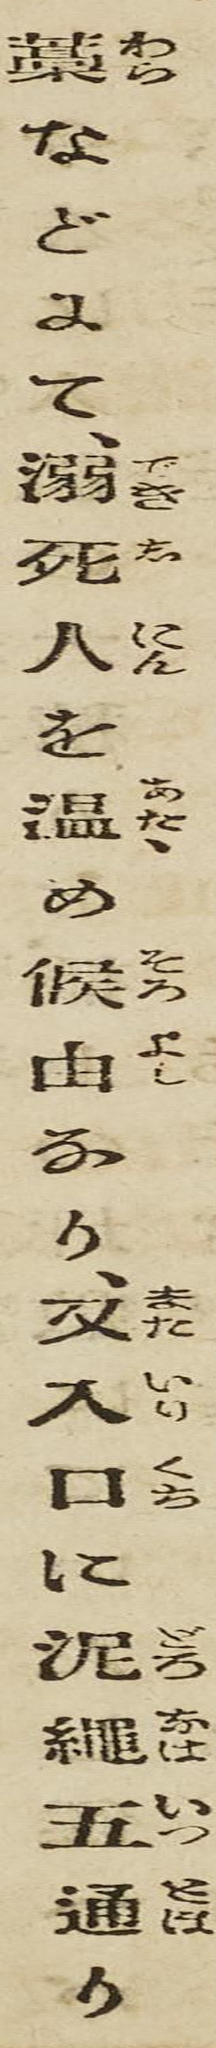藁などにて、溺死人を温め候由なり、又入口に泥縄五通り
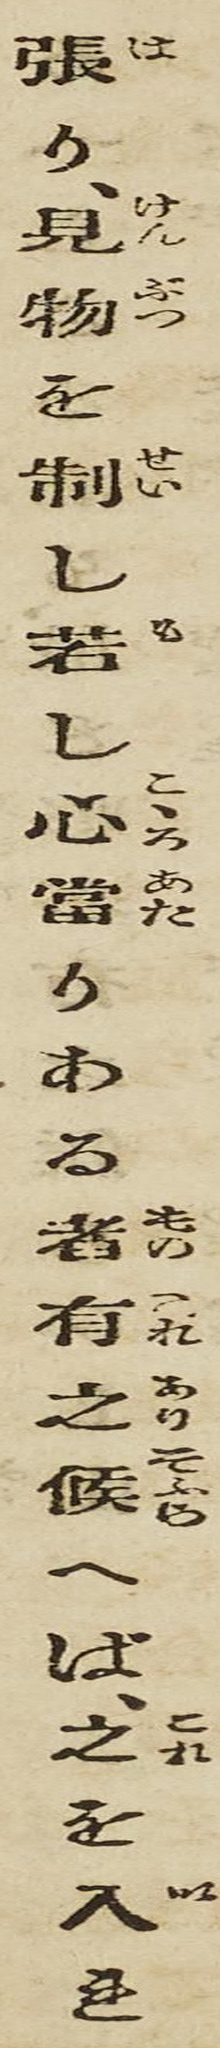張り、見物を制し若し心当りある者有之候へば、之を入れ
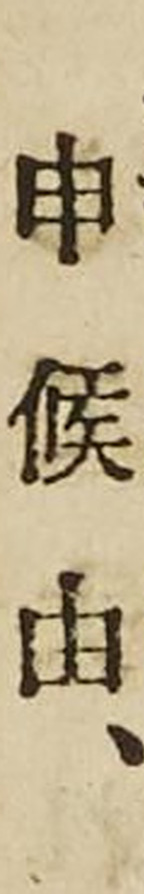申候由、
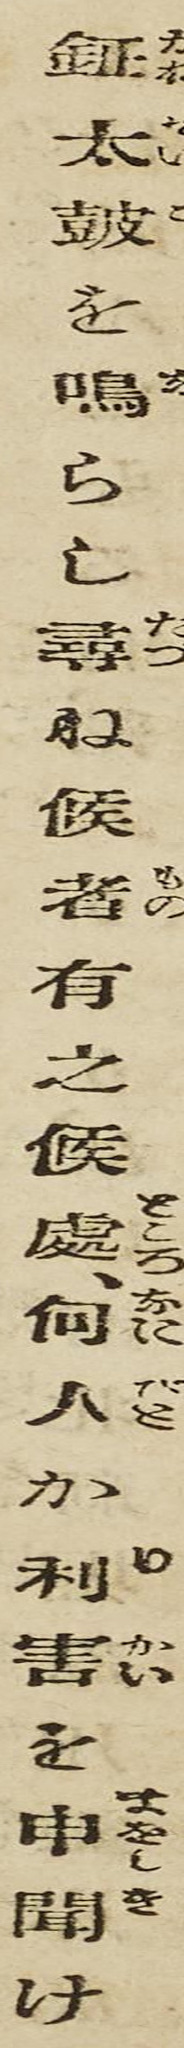鉦太鼓を鳴らし尋ね候者有之候処、何人か利害を申聞け
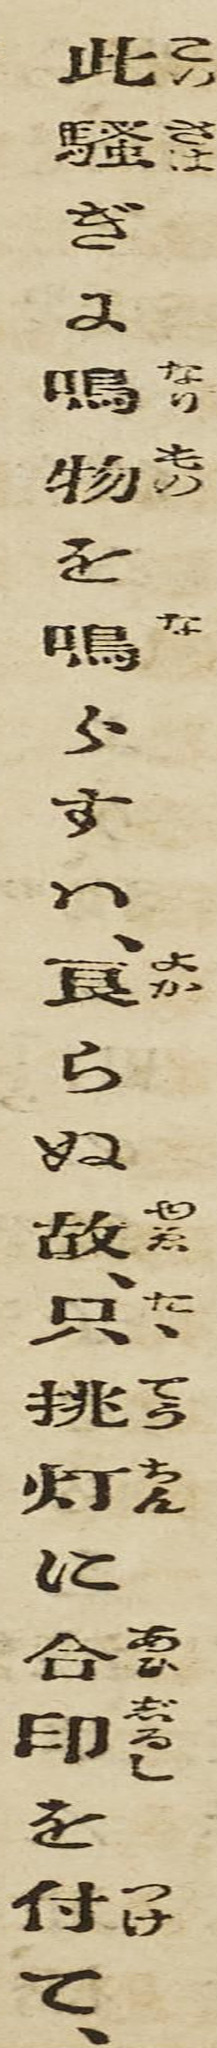此騒ぎに鳴物を鳴らすは、良らぬ故、只挑灯に合印を付て、
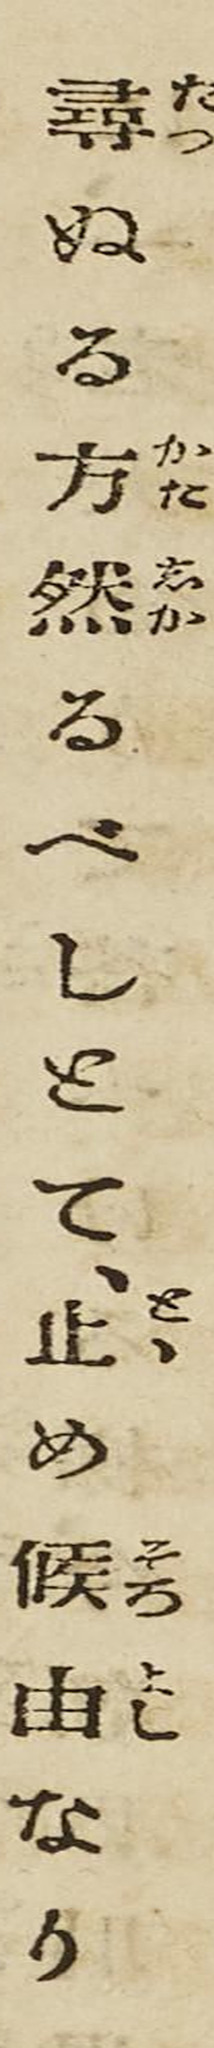尋ぬる方然るべしとて、止め候由なり
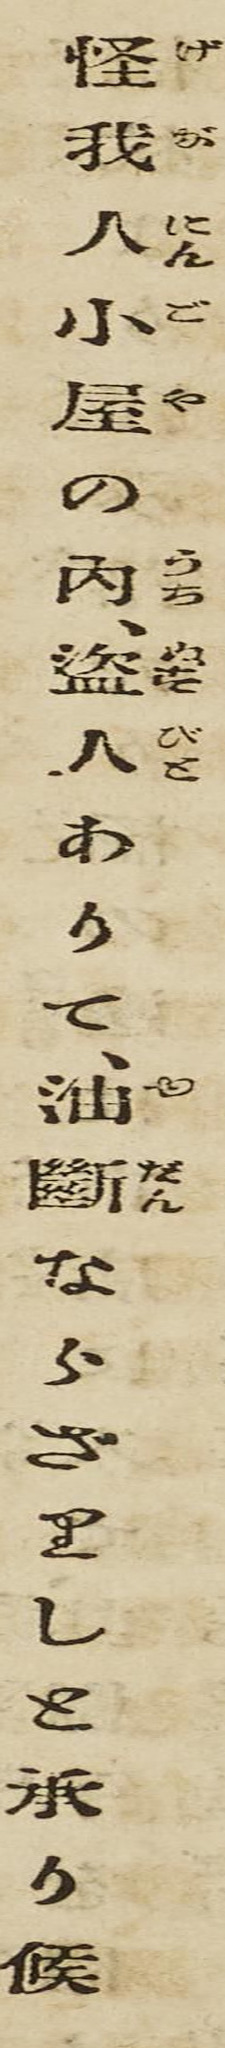怪我人小屋の内、盗人ありて、油断ならざりしと承り候
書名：永代惨話　文化の夢　全
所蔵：東京大学地震研究所図書室 Earthquake Research Institute Library, The University of Tokyo, JAPAN
